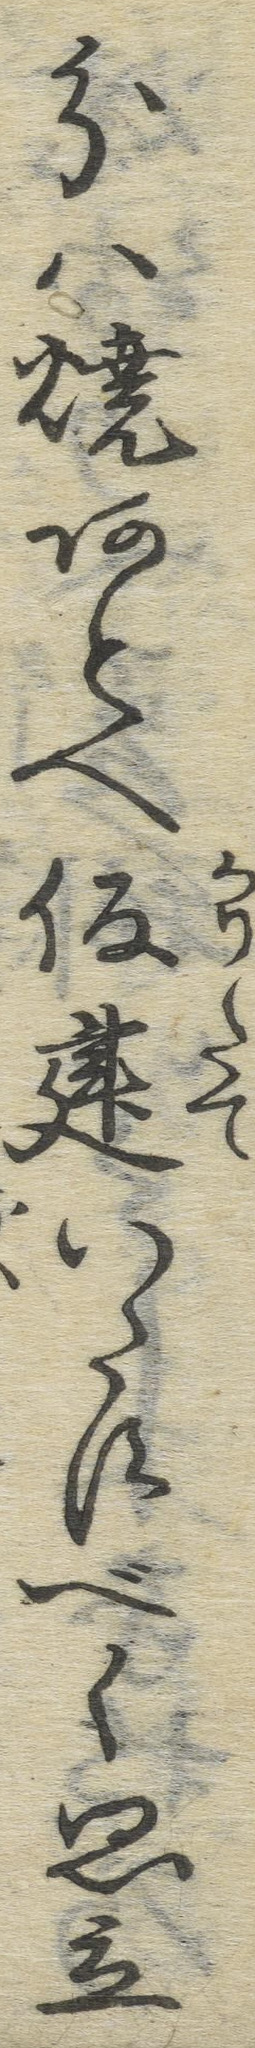分は焼あとへ仮建いたすべく思立
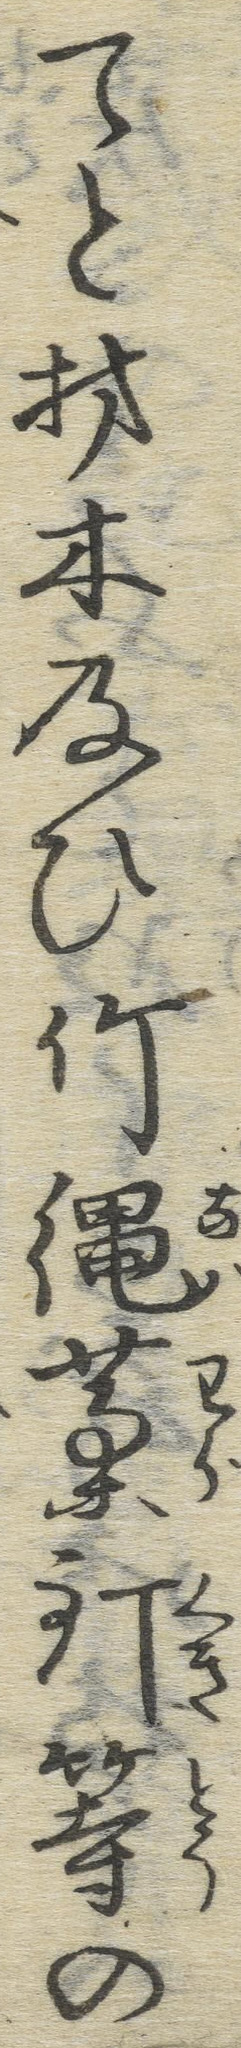てと材木及ひ竹縄藁釘等の
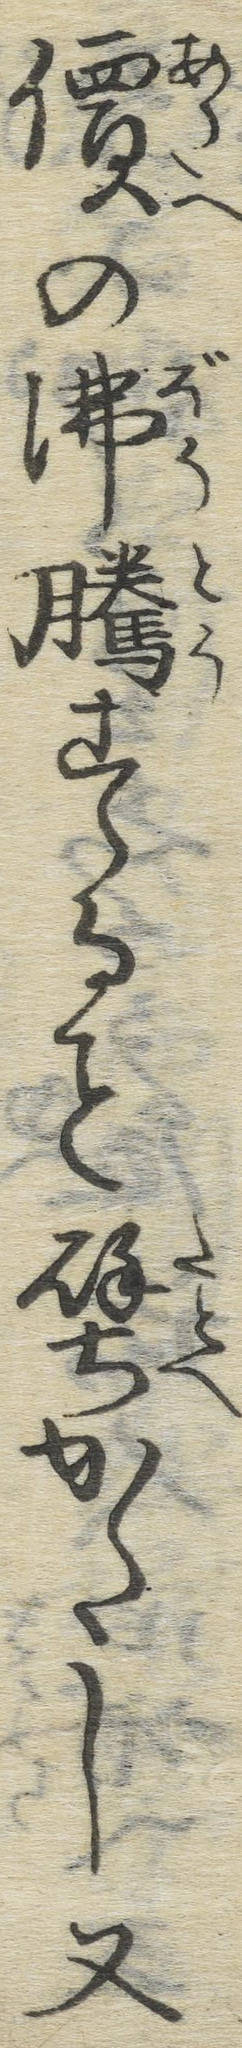價の沸騰すること壁かたし又
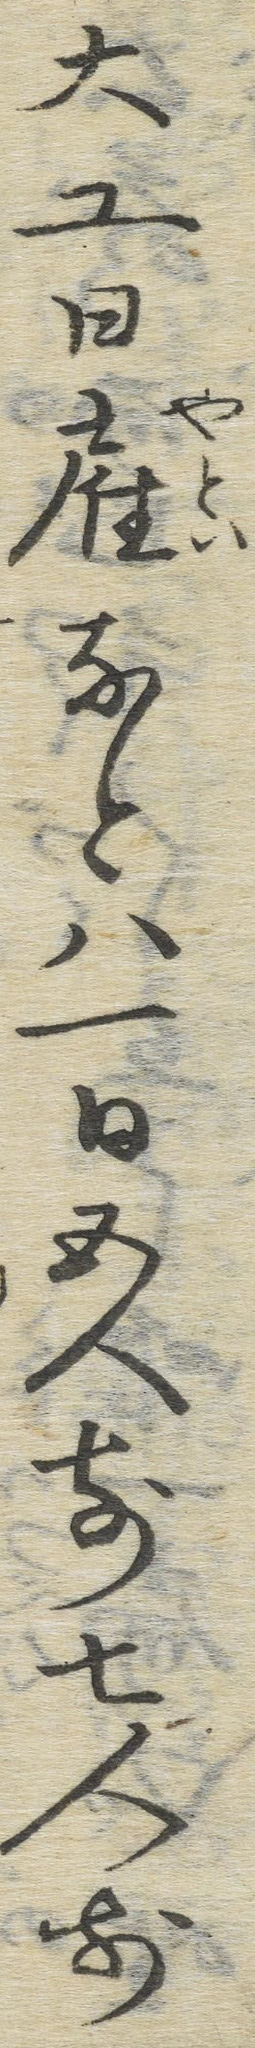大工日雇なとは一日五人前七人前
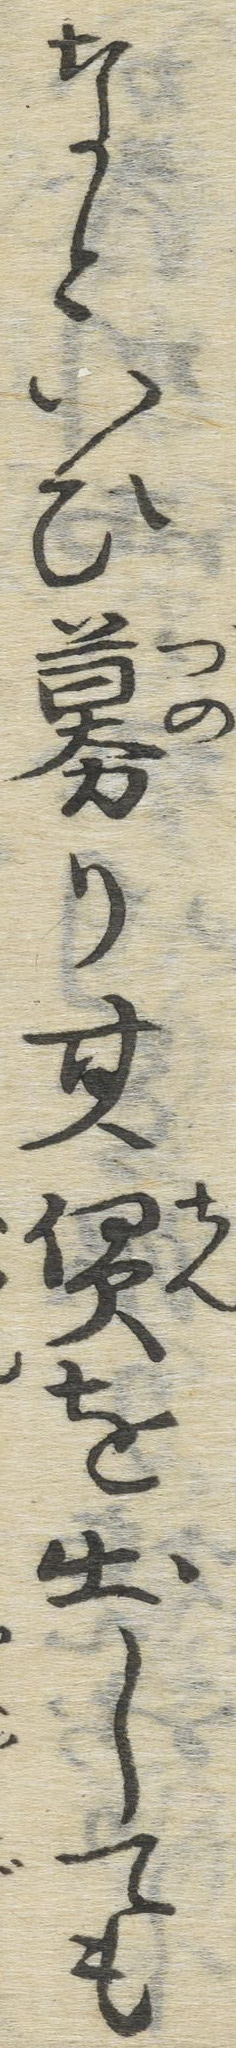なといひ募り其賃を出しても
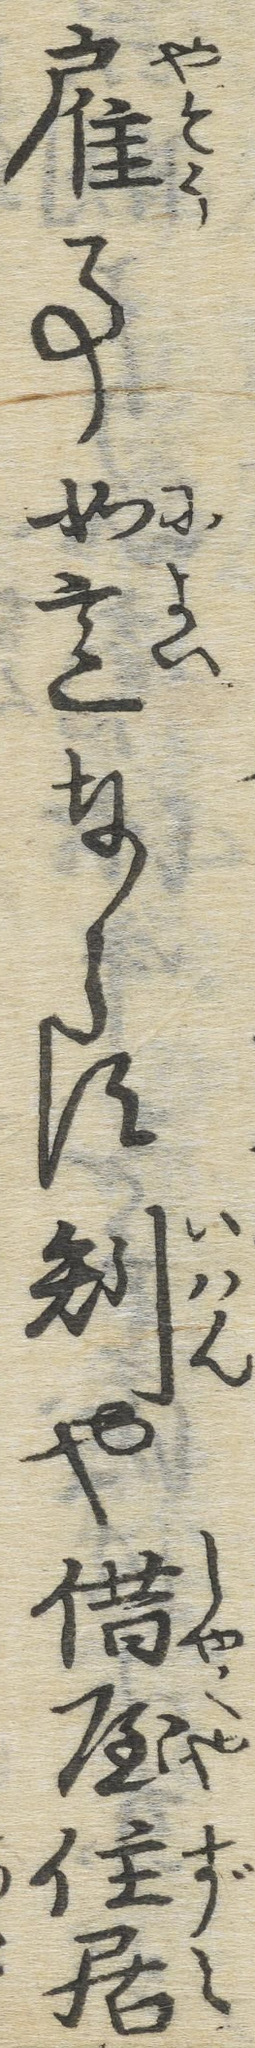雇事如意ならす矧や借家住居
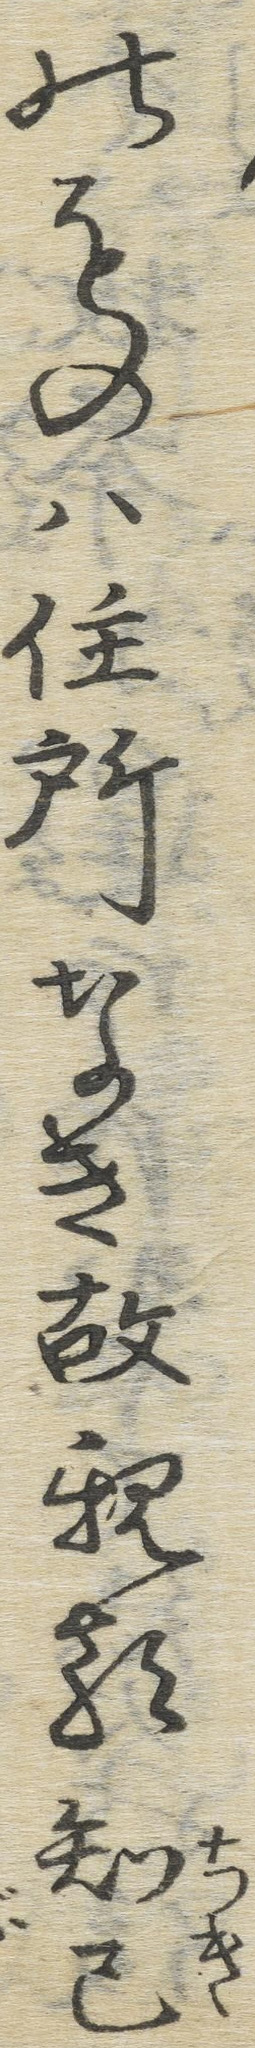のものは住所なき故親類知己
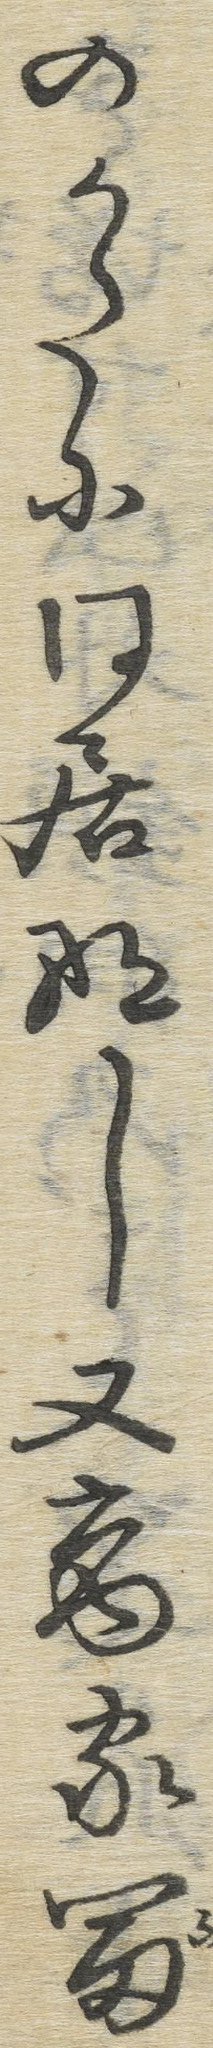のかたに同居なし又商家冨
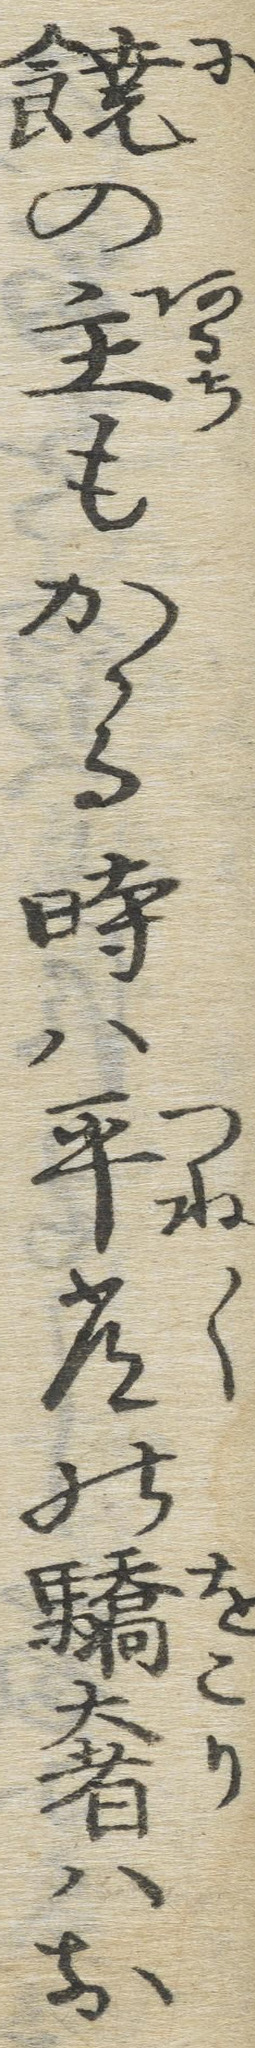饒の主もかゝる時は平常の驕奢はお
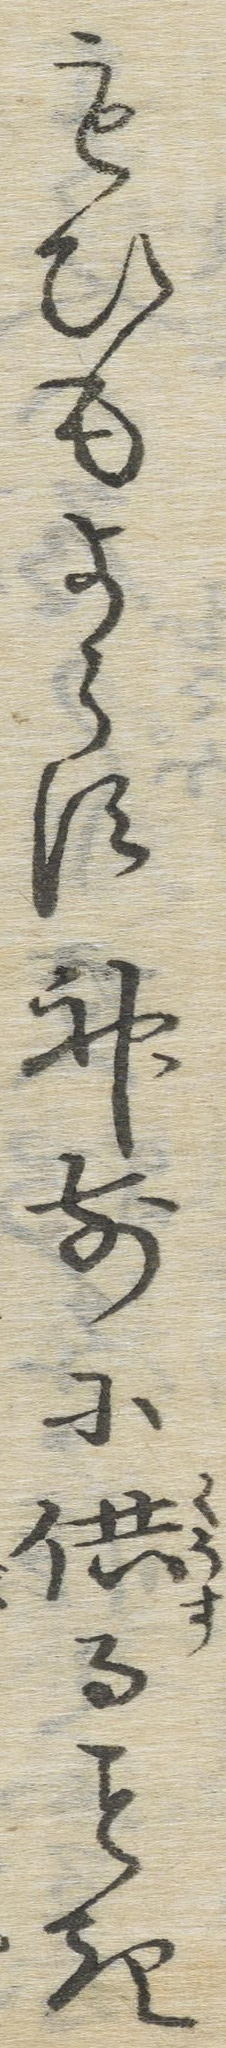もひもよらす神前に供ることき
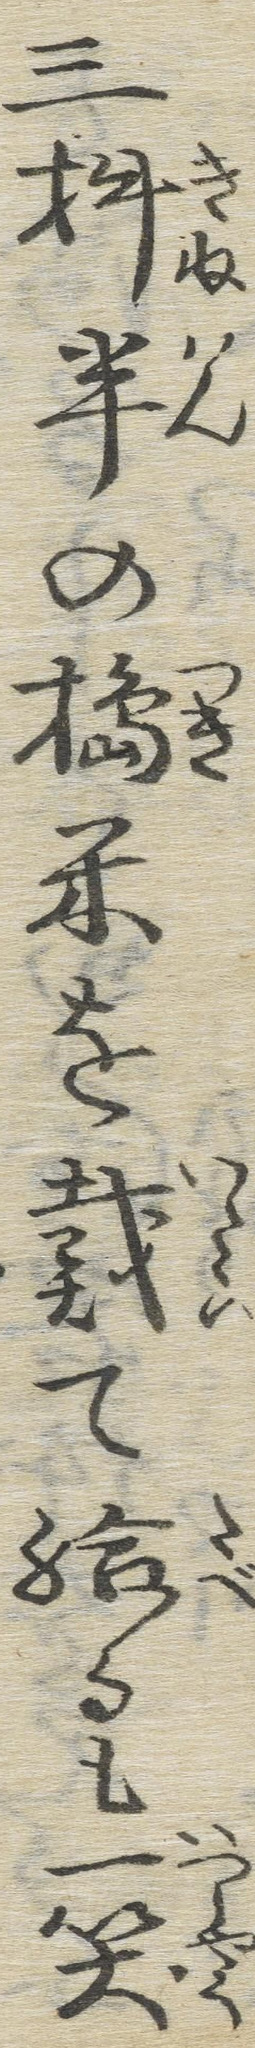三杵半の搗米を戴て給るも一笑
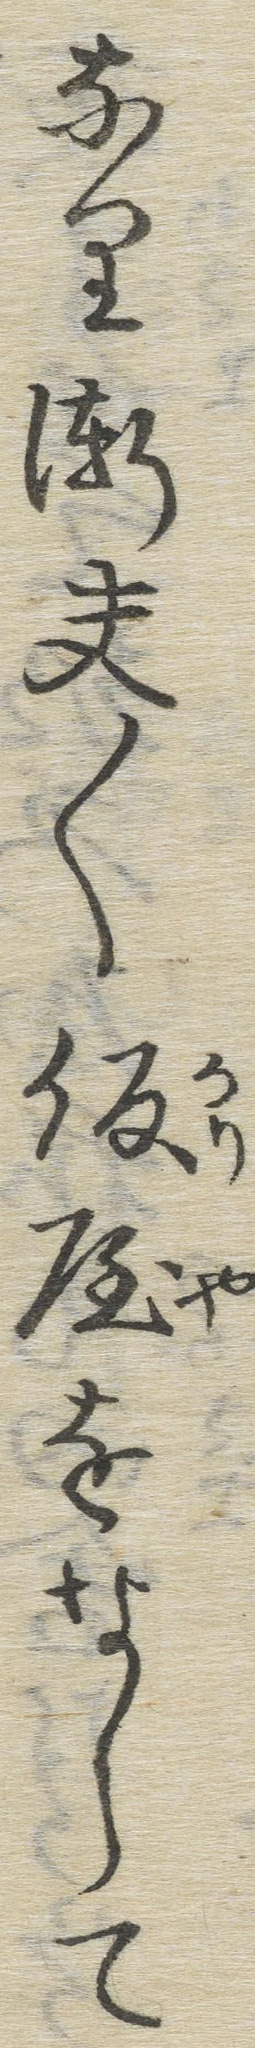なり漸夫〳〵仮屋をなして
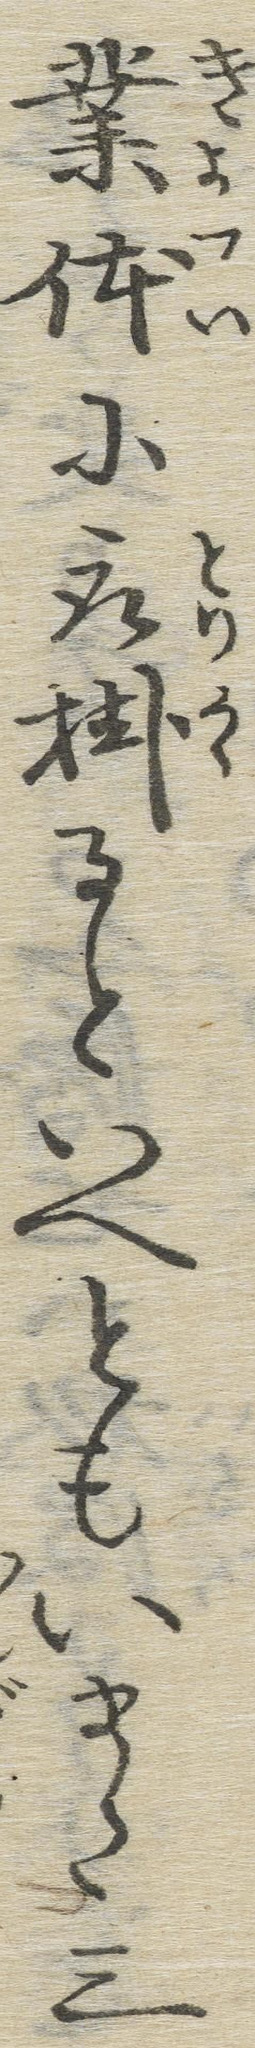業体に取掛るといへともいまた三
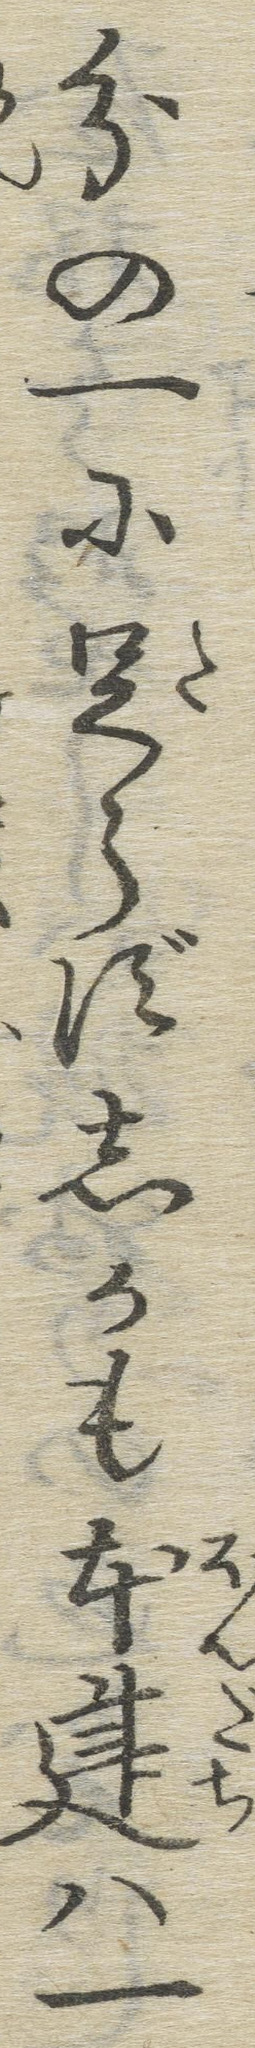分の一に足らずしかも本建は一
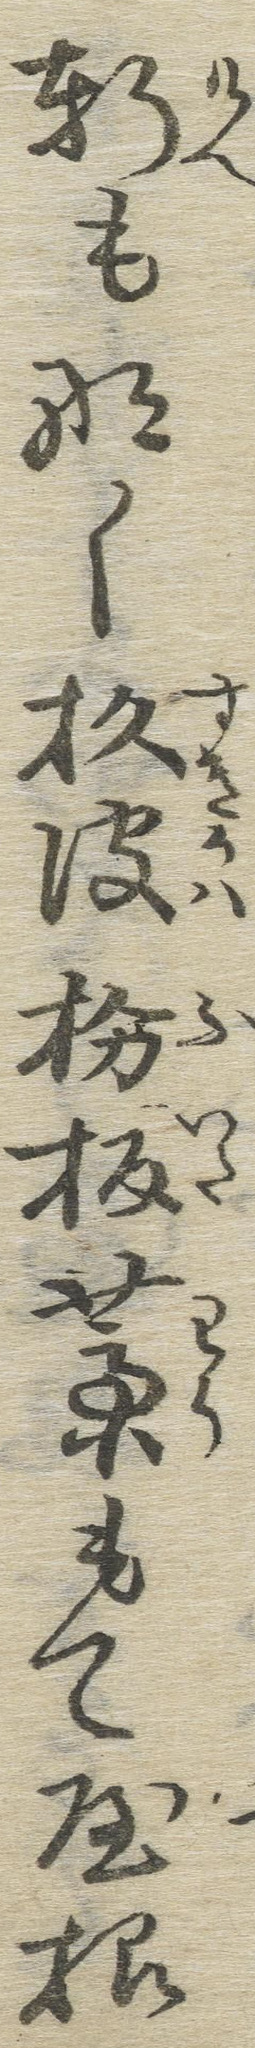軒もなく杦波枌板藁もて屋根
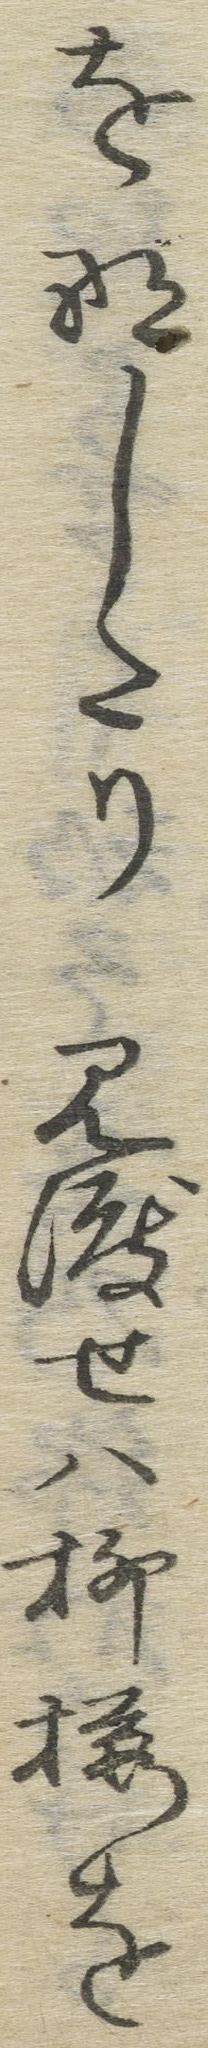をなしたり見渡せは柳桜を
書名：あきの日照
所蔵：東京大学地震研究所図書室 Earthquake Research Institute Library, The University of Tokyo, JAPAN
